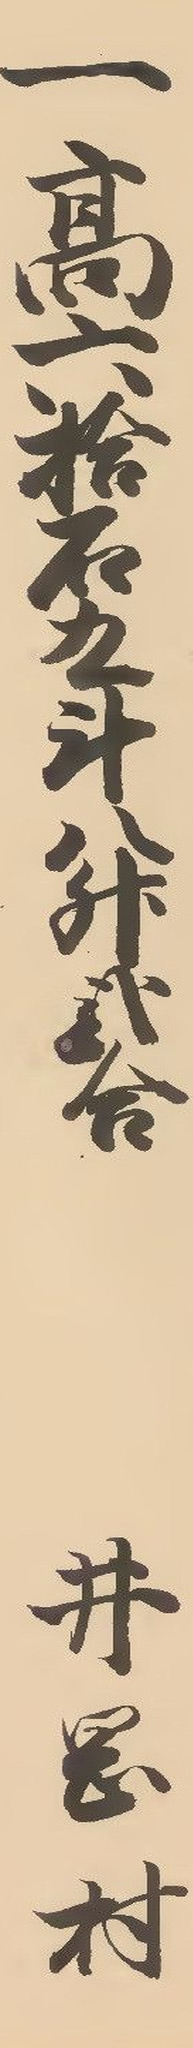一高六拾石九斗八升弐合井岡村
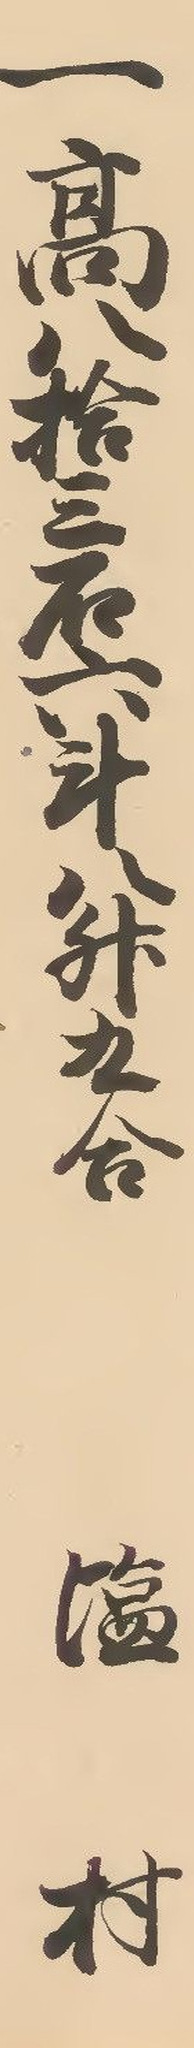一高八拾三石六斗八升九合塩村
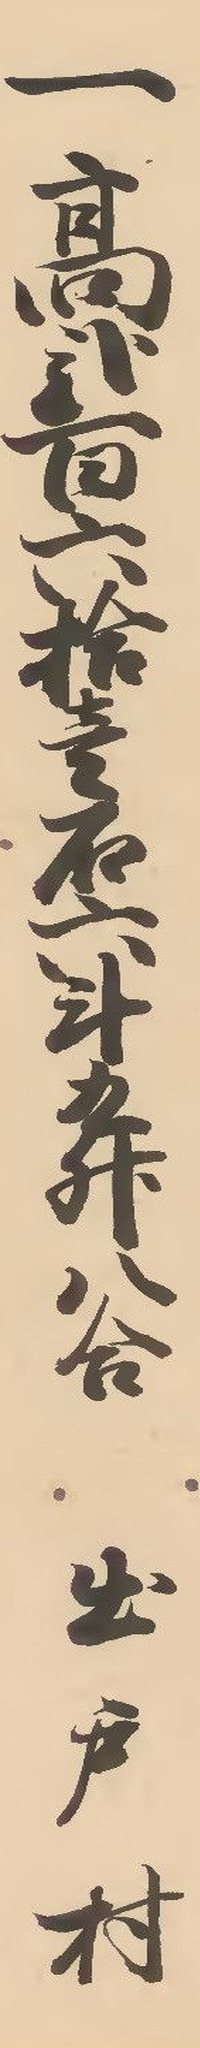一高弐百六拾壱石六斗九升八合出戸村

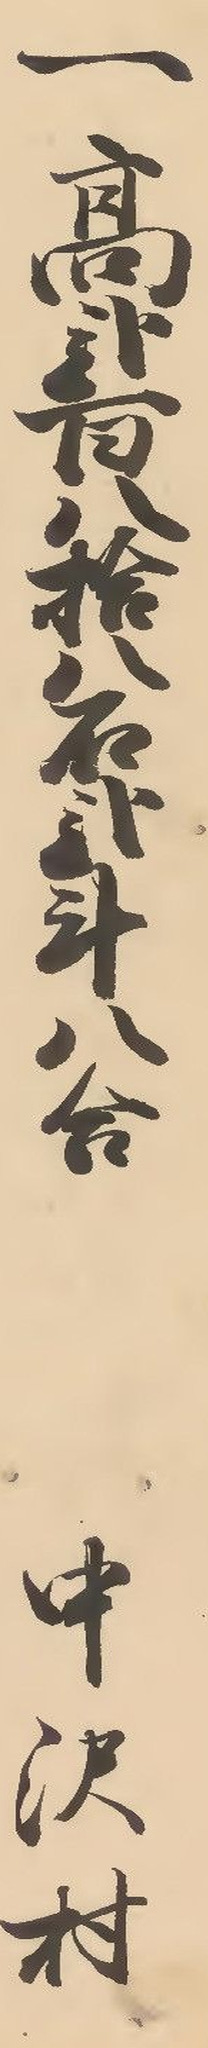一高弐百八拾八石弐斗八合中沢村
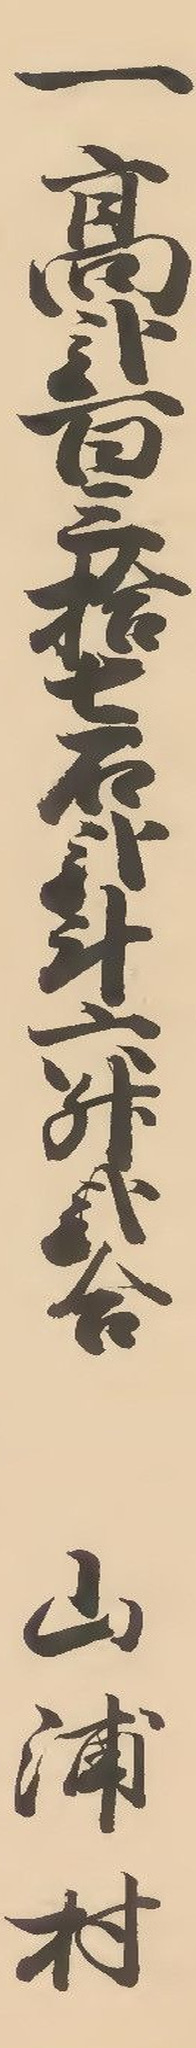一高弐百三拾七石弐斗六升弐合山浦村
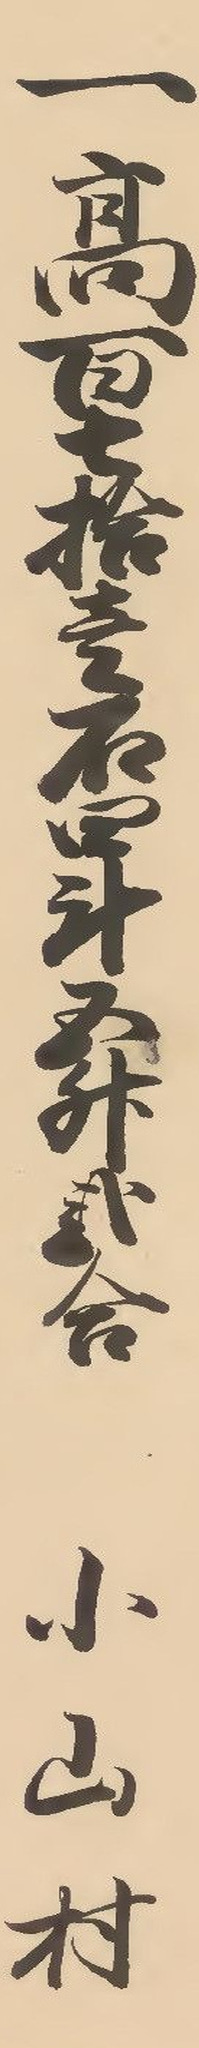一高百七拾壱石四斗五升弐合小山村
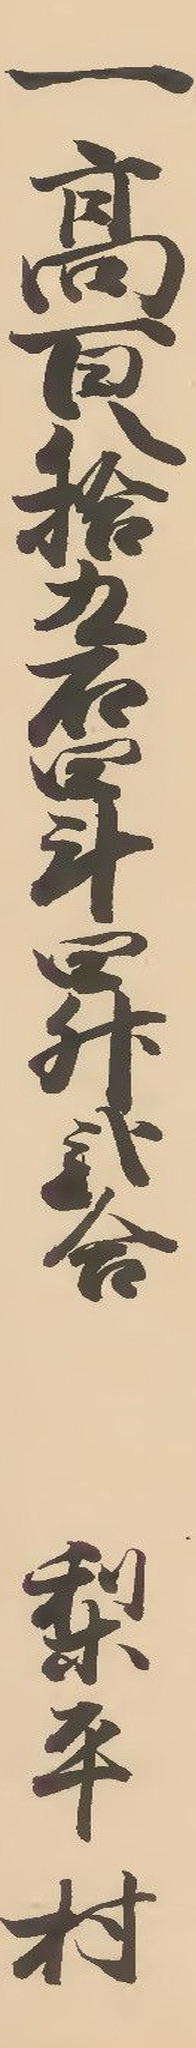一高百八拾九石四斗四升弐合梨平村
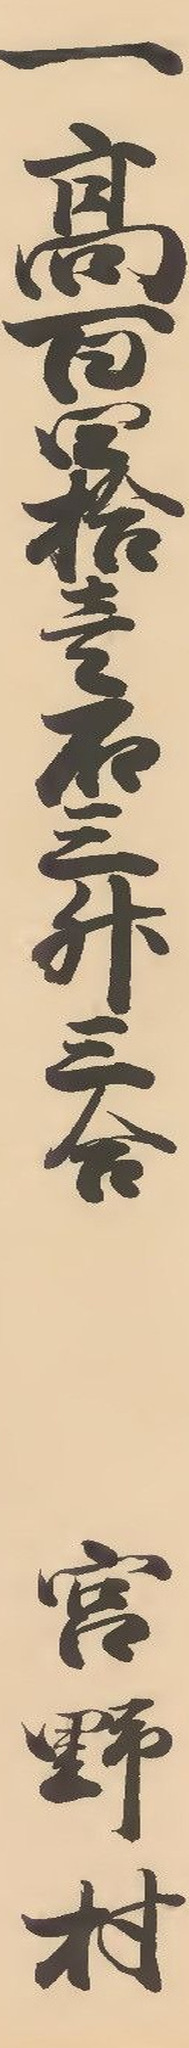一高百四拾壱石三升三合宮野村
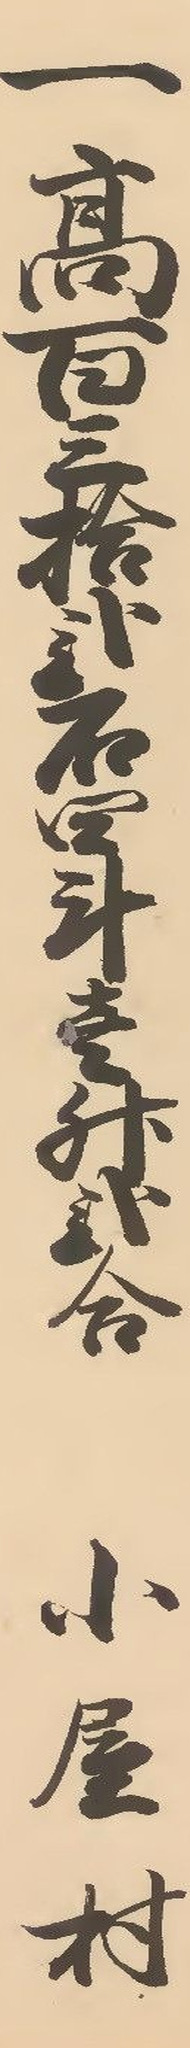一高百三拾弐石四斗壱升弐合小屋村
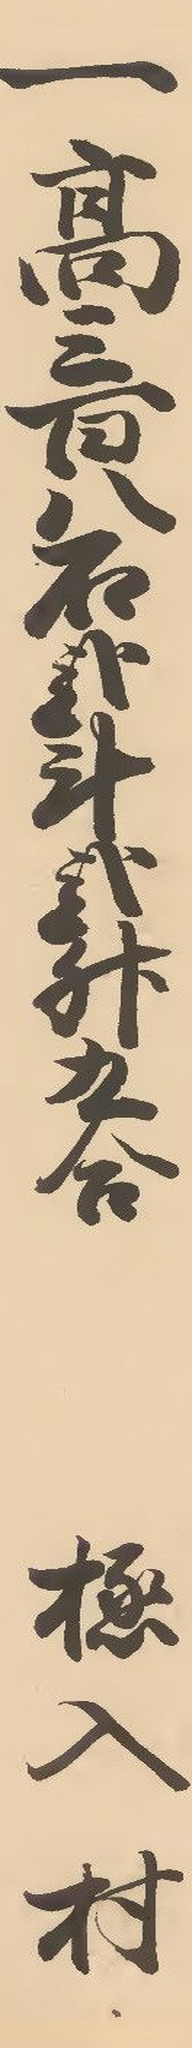一高三百八石弐斗弐升九合極入村
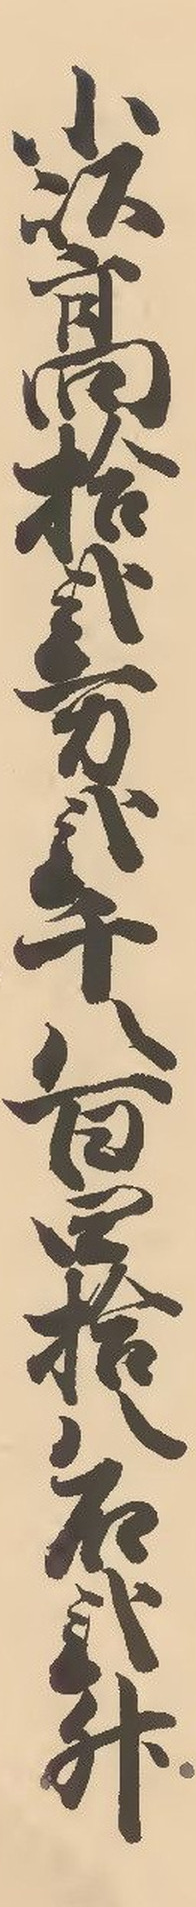小以高拾弐万弐千八百四拾八石弐升

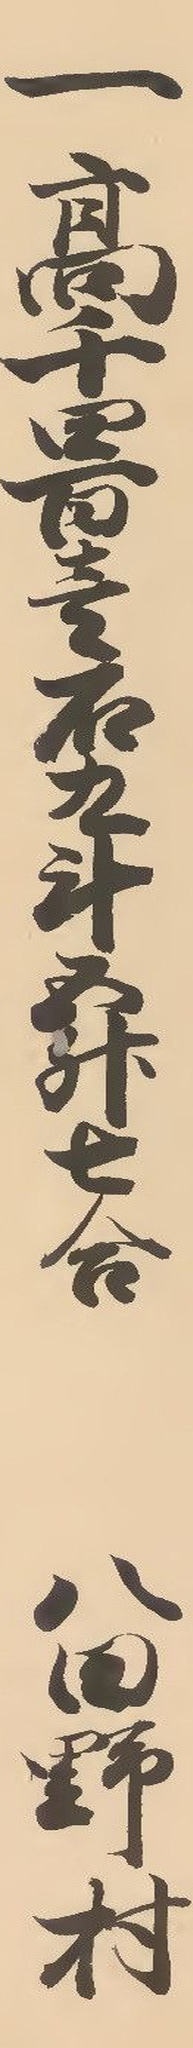一高千四百壱石九斗五升七合八田野村
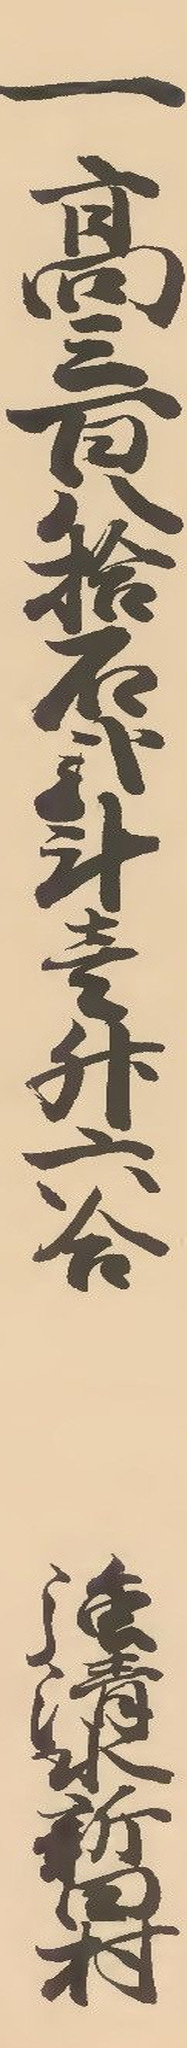一高三百八拾石弐斗壱升六合強清水新田村
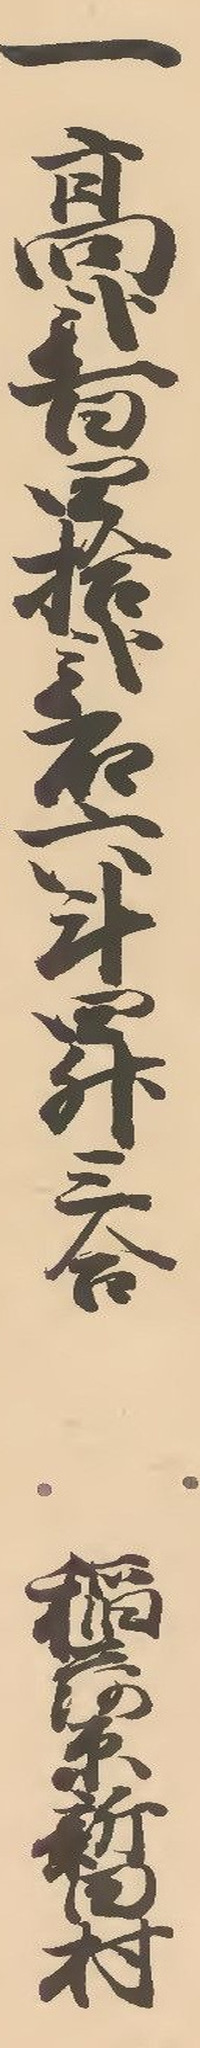一高弐百四拾弐石六斗四升三合稲荷原新田村

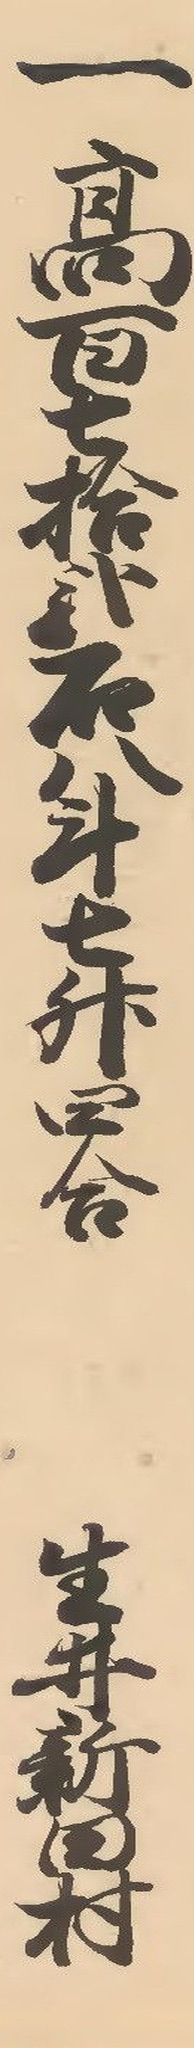一高百七拾弐石八斗七升四合生井新田村
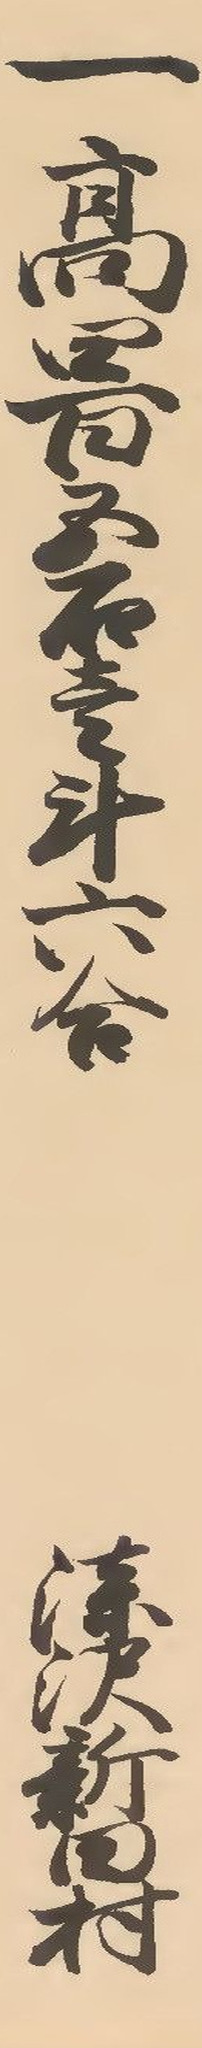一高四百五石壱斗六合漆沢新田村
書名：陸奥国郷帳　１
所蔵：国立公文書館 National Archives of Japan
